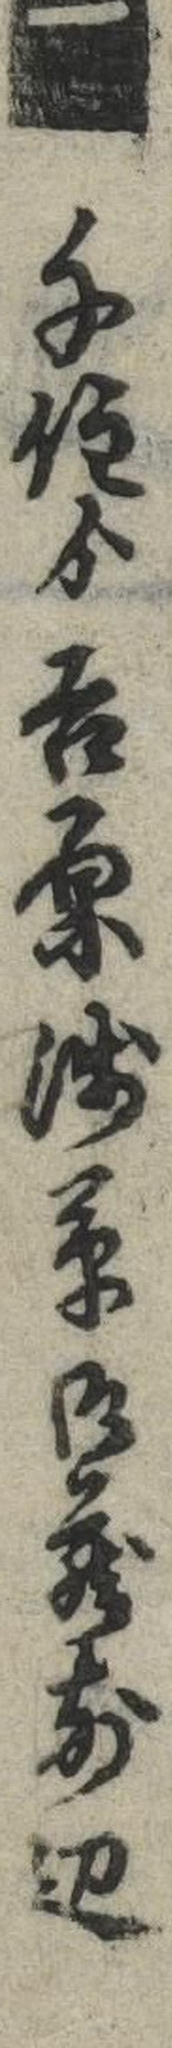一千住ゟ吉原浅草御蔵前辺
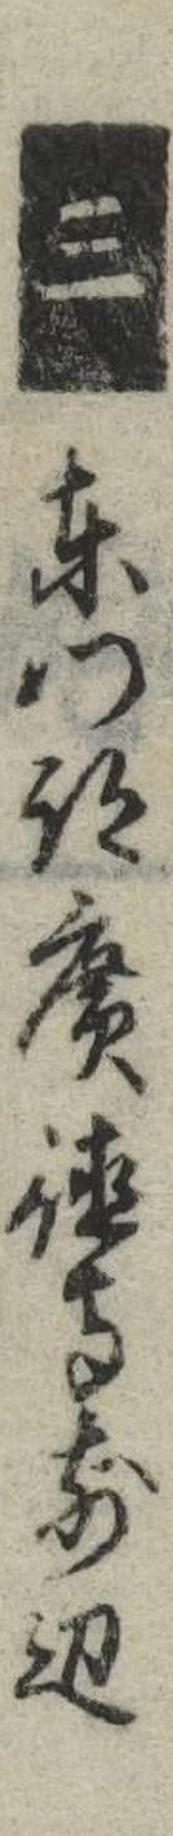三東門跡広徳寺前辺
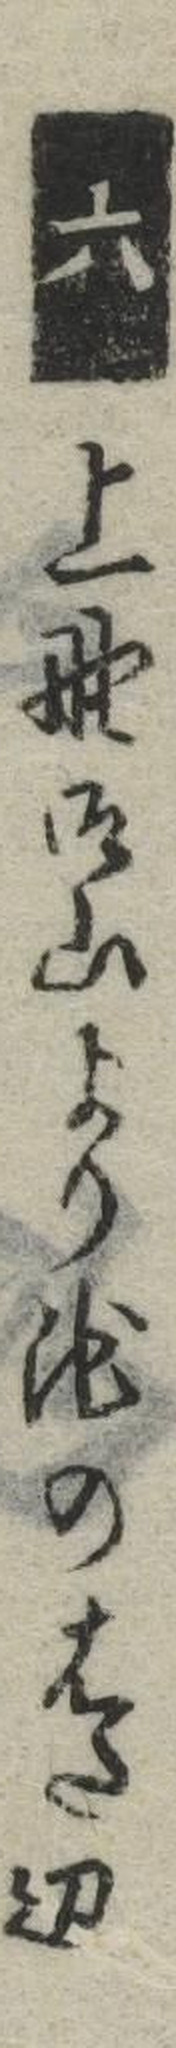六上野御山より池のはた辺
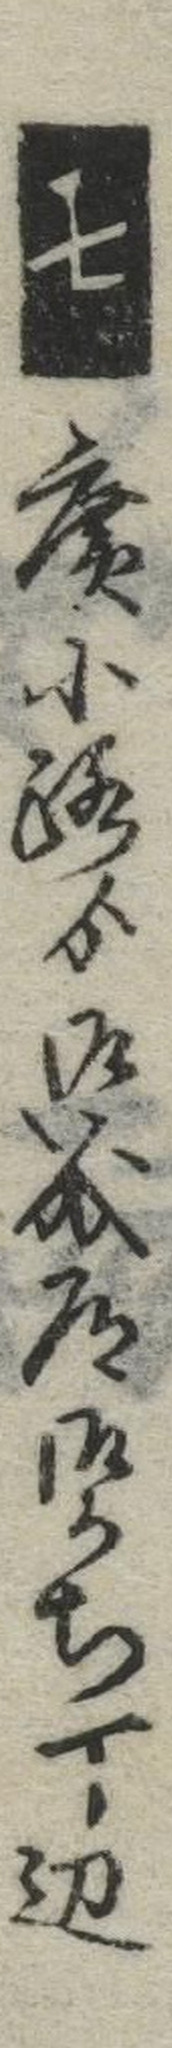七広小路ゟ御成道御かち丁辺
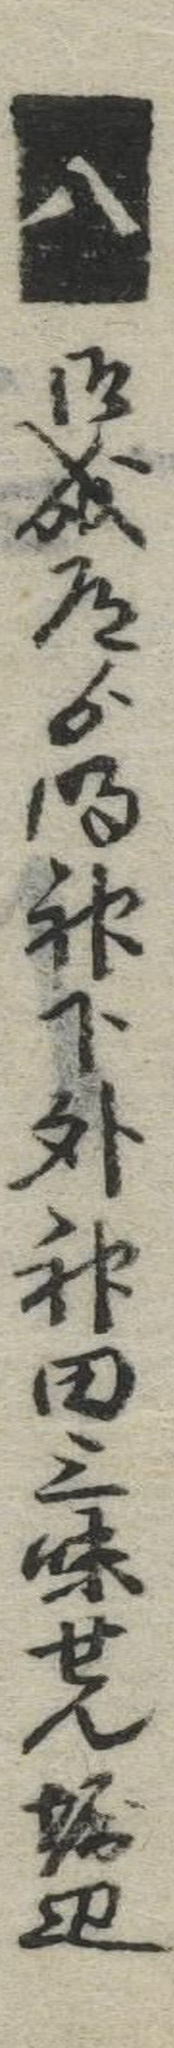八御成道ゟ明神下外神田三味せん堀辺
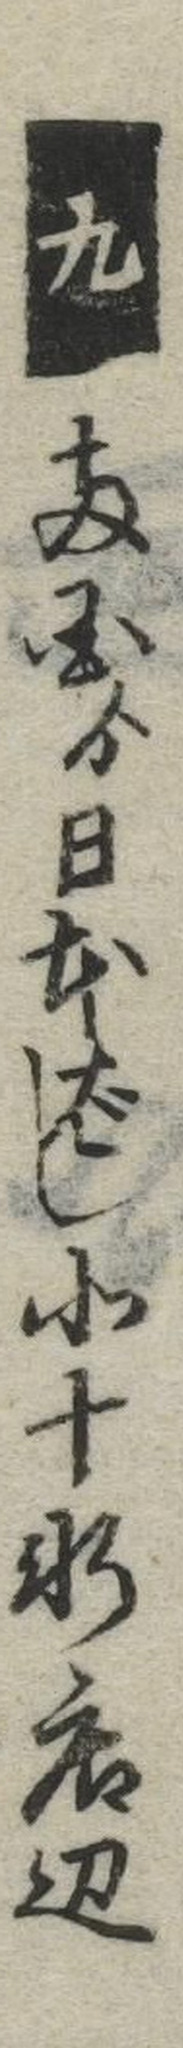九両国ゟ日本ばし北十軒店辺
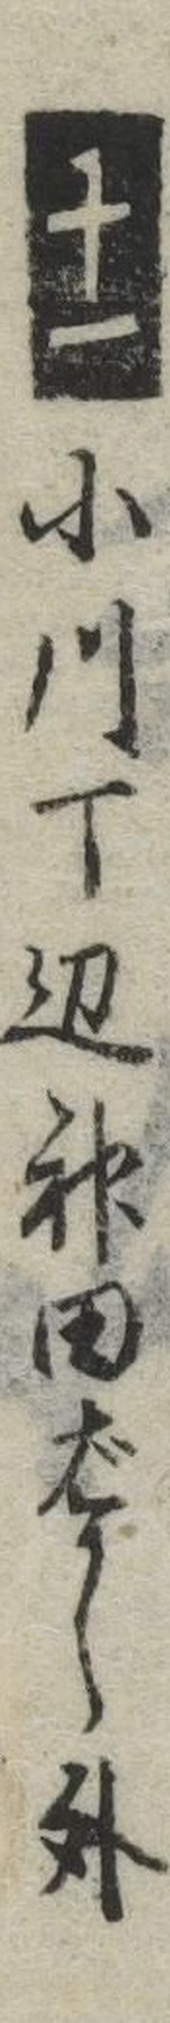十一小川丁辺神田ばし外
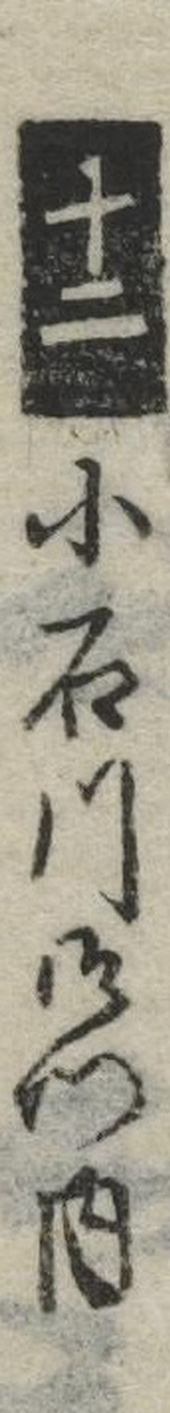十二小石川御門内
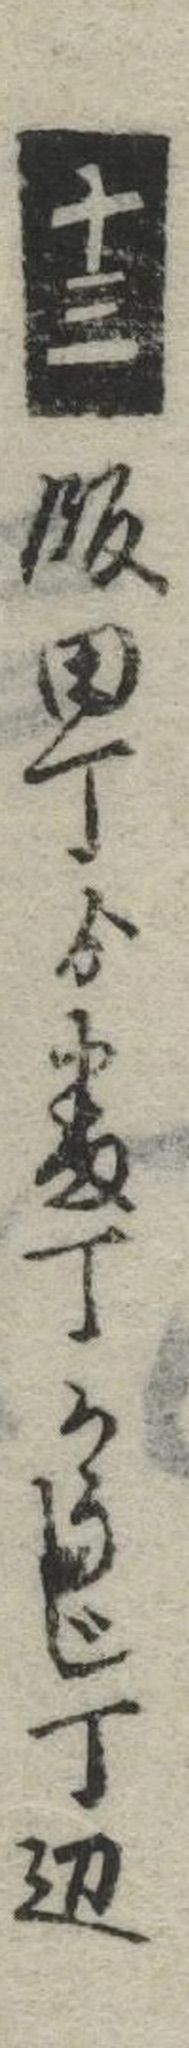十三飯田丁番町かうじ丁辺
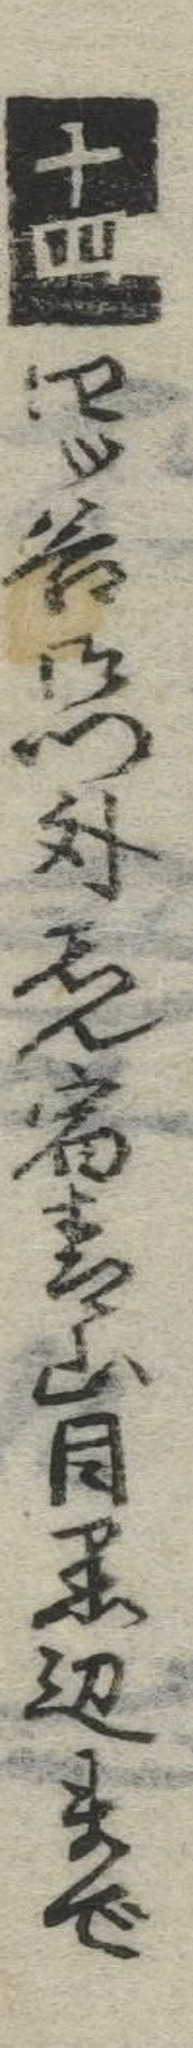十四四ッ谷御門外しん宿青山目黒辺まで
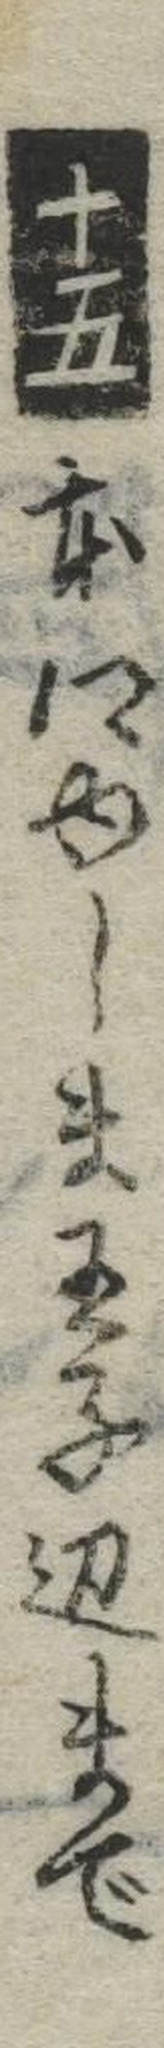十五本郷ゆしま王子辺まで
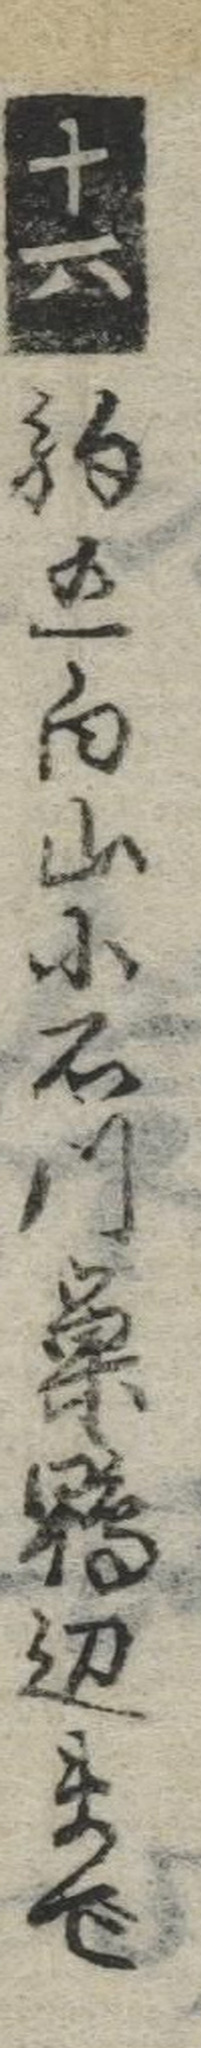十六駒込白山小石川巣鴨辺まで
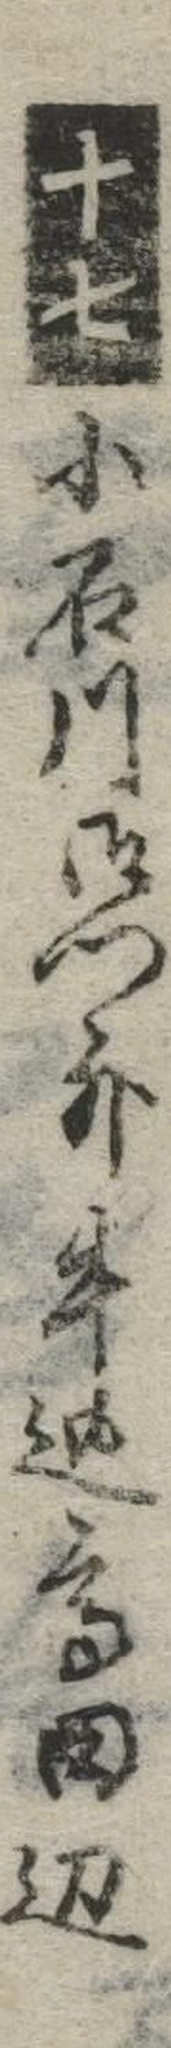十七小石川御門外牛込高田辺
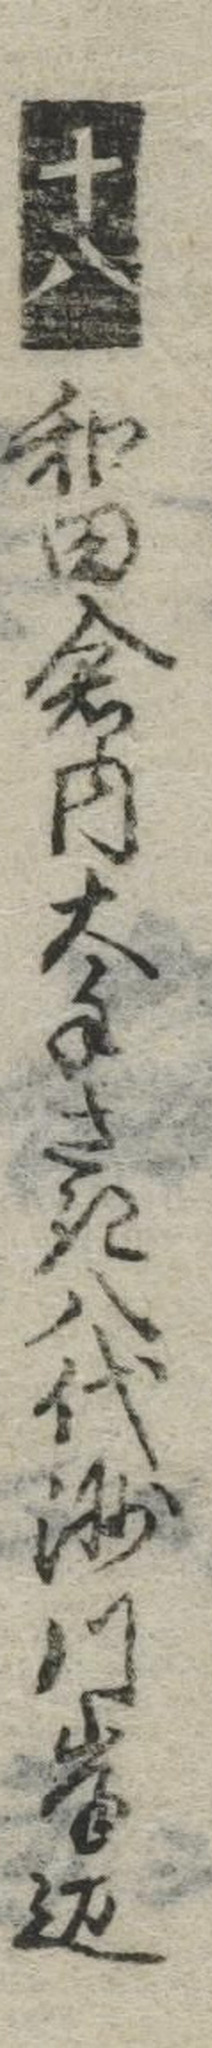十八和田倉門大手さき八代洲川岸辺
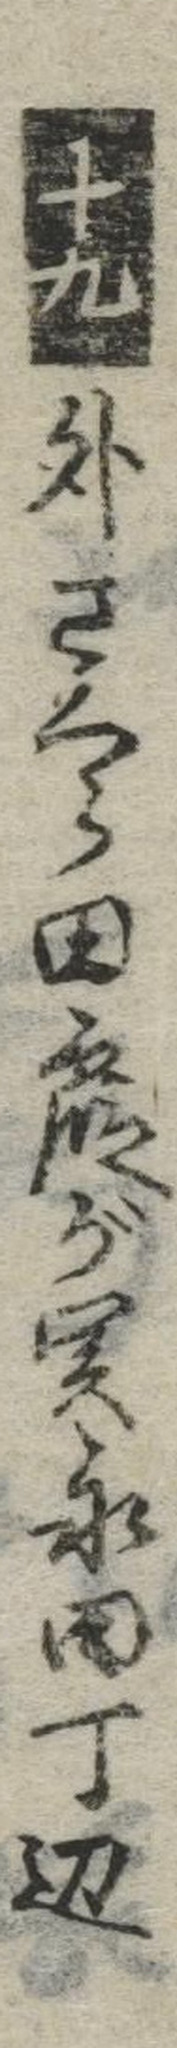十九外さくら田霞が関永田丁辺
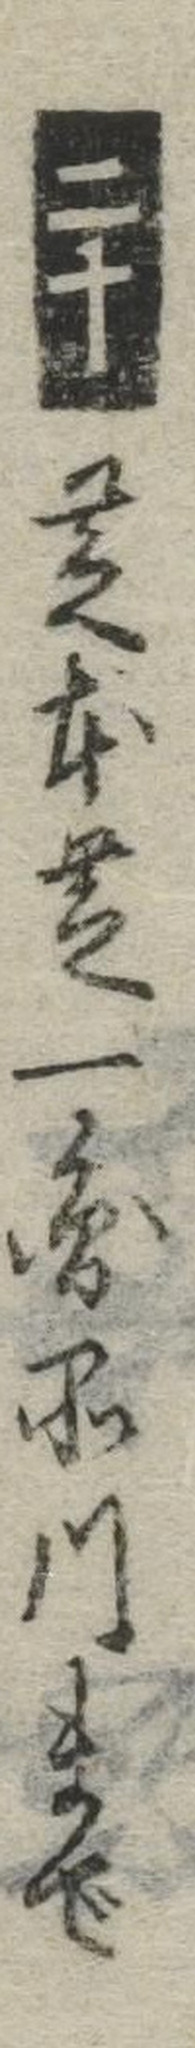二十芝本芝一円品川まで
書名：安政二卯十月二日夜四ツ時過　御府内御屋敷方市中共　地震類焼場所明細書之寫　并街道筋近郷聞書
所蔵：東京大学地震研究所図書室 Earthquake Research Institute Library, The University of Tokyo, JAPAN
